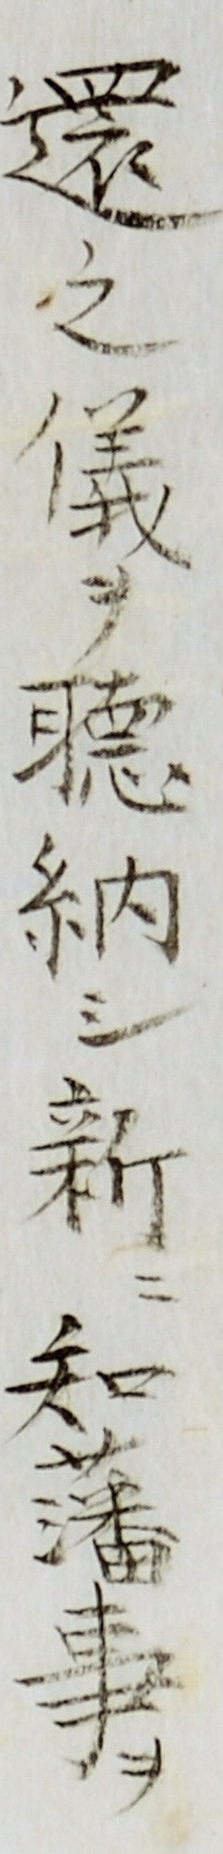還之儀ヲ聴納シ新ニ知藩事ヲ
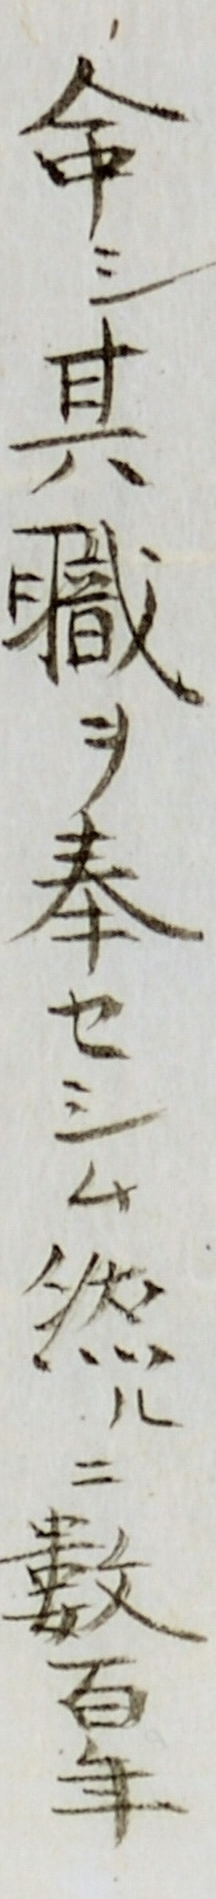命シ其職ヲ奉セシム然ルニ数百年
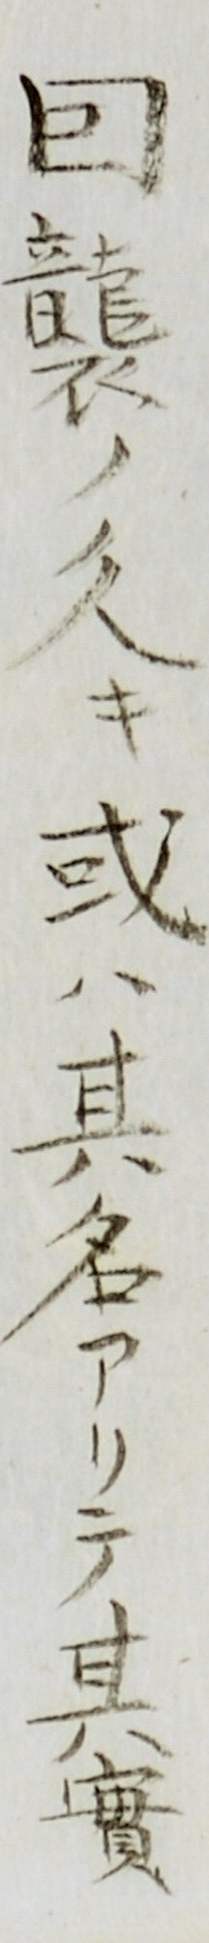因習ノ久キ或ハ其名アリテ其実
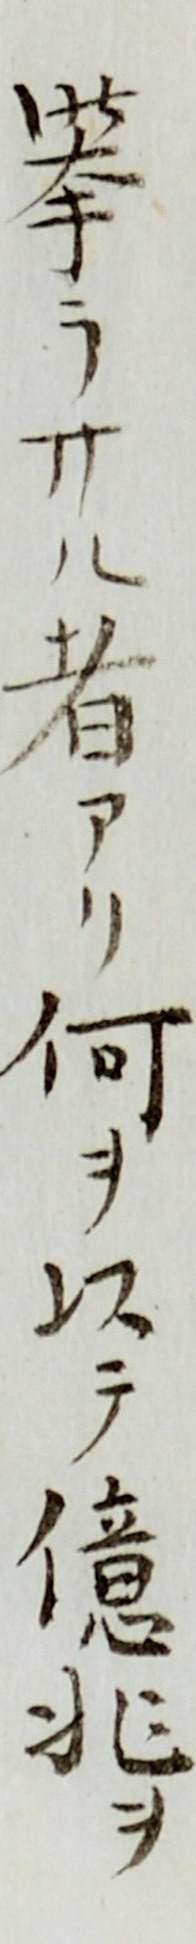挙ラサル者アリ何ヲ以テ億兆ヲ
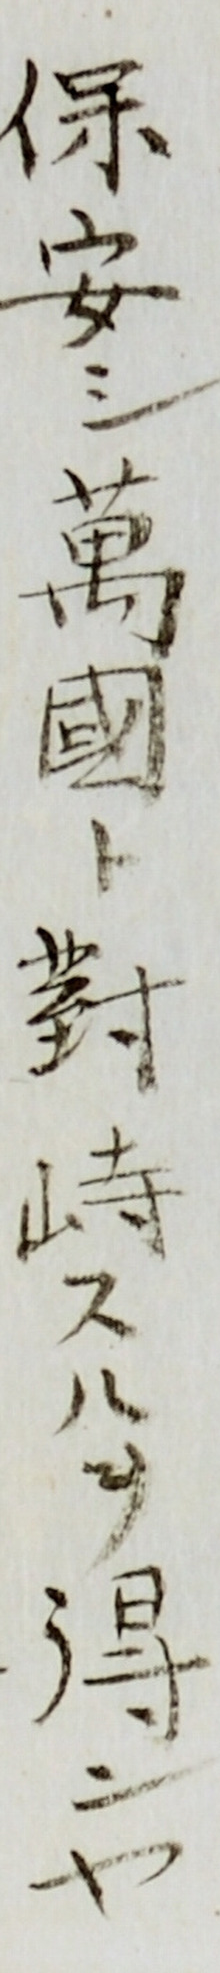保安シ万国ト対峙スルヲ得ンヤ
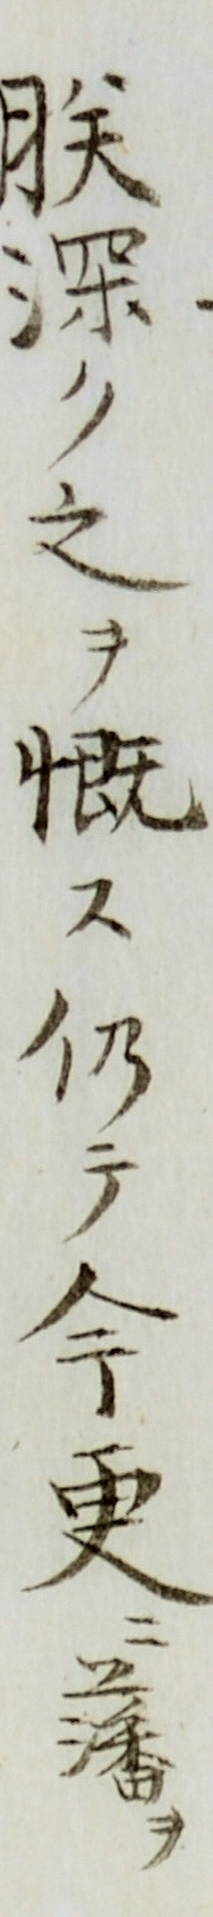朕深ク之ヲ慨ス仍テ今更ニ藩ヲ
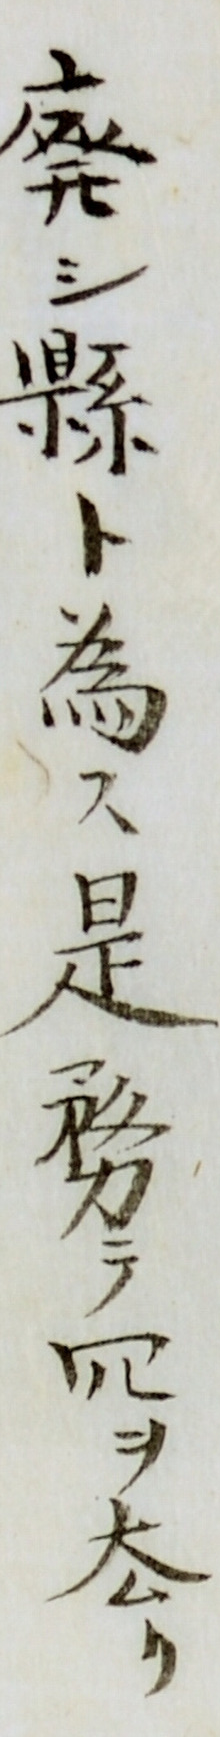廃シ県ト為ス是務冗ヲ去リ
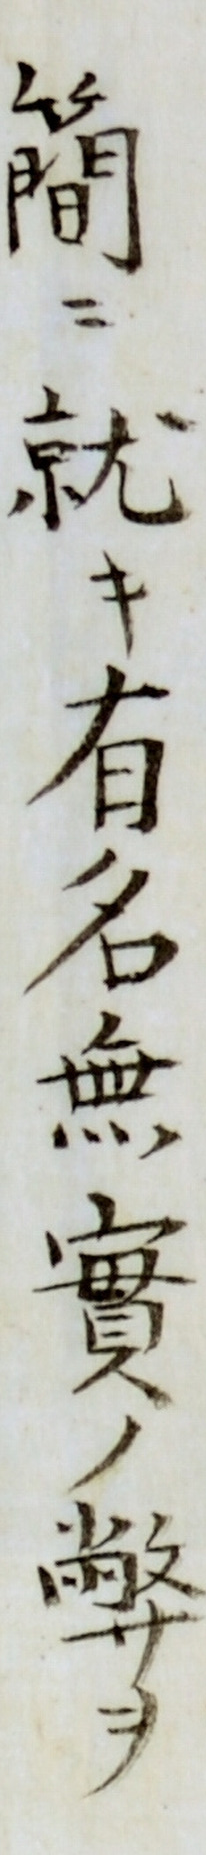簡ニ就キ有名無実ノ弊ヲ
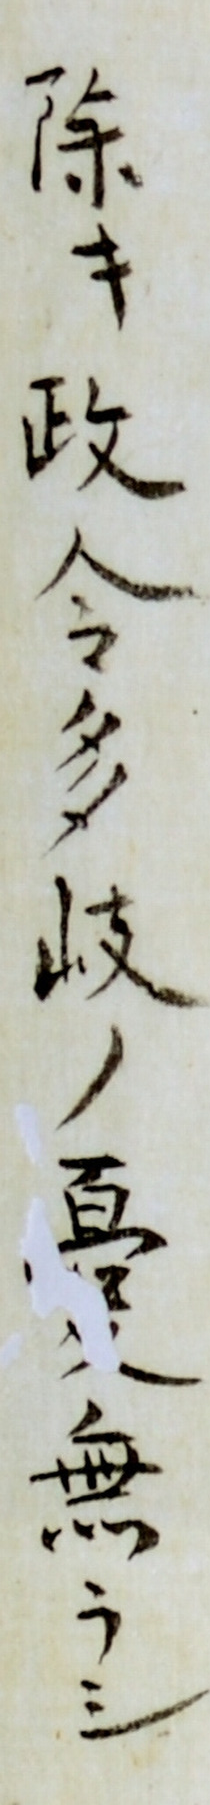除キ政令多岐ノ憂無ラシ

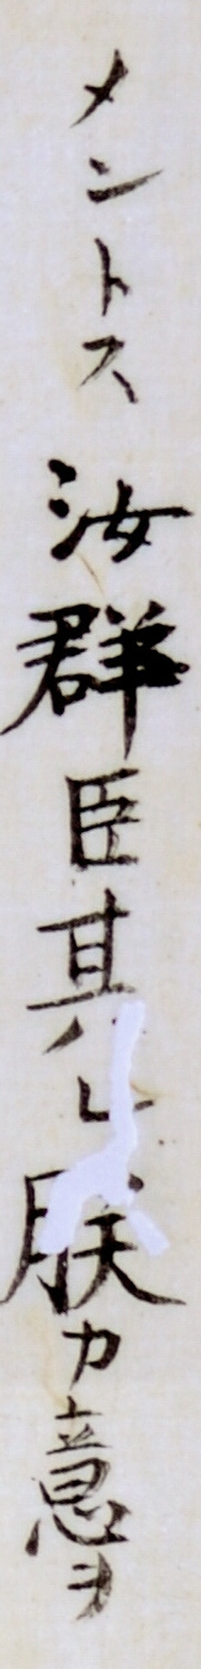メントス汝群臣其レ朕カ意ヲ
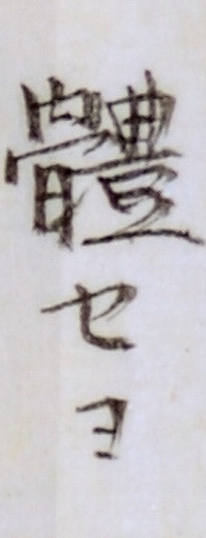体セヨ
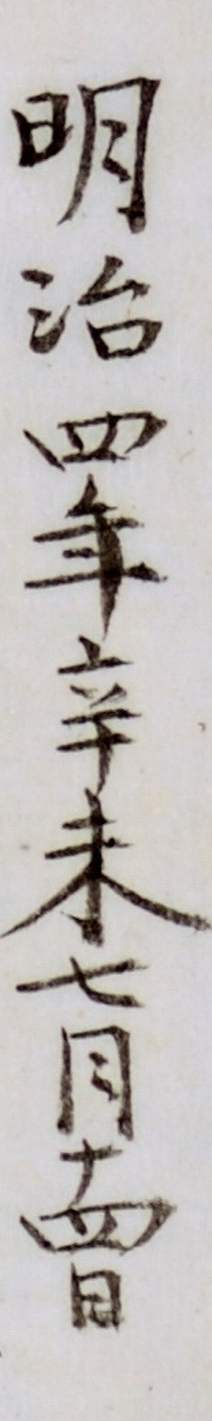明治四年辛未七月十四日
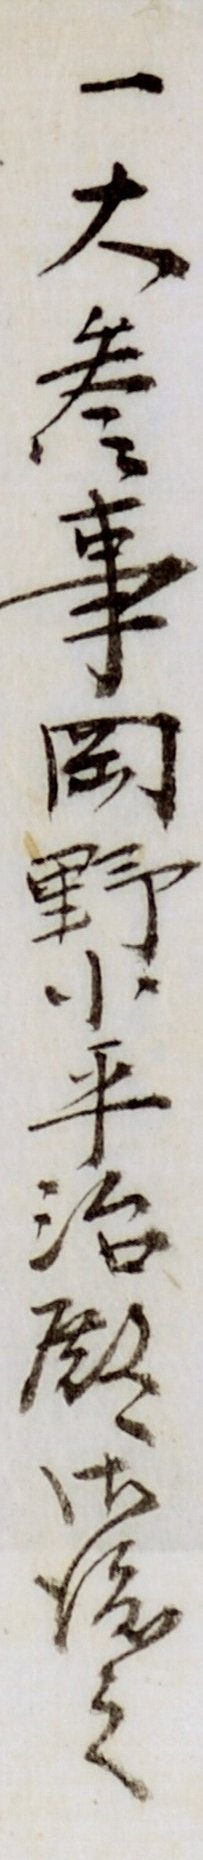一大参事岡野小平治殿へ御渡之
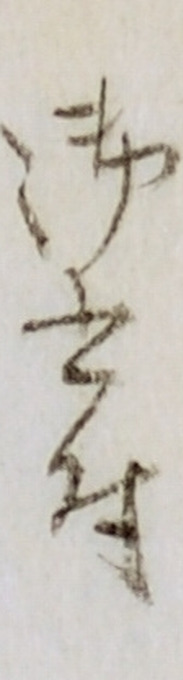御書付
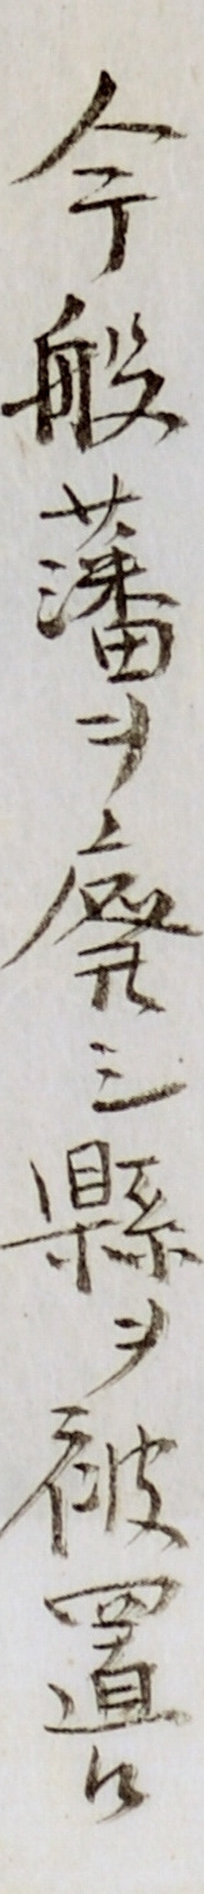今般藩ヲ廃シ県ヲ被置候
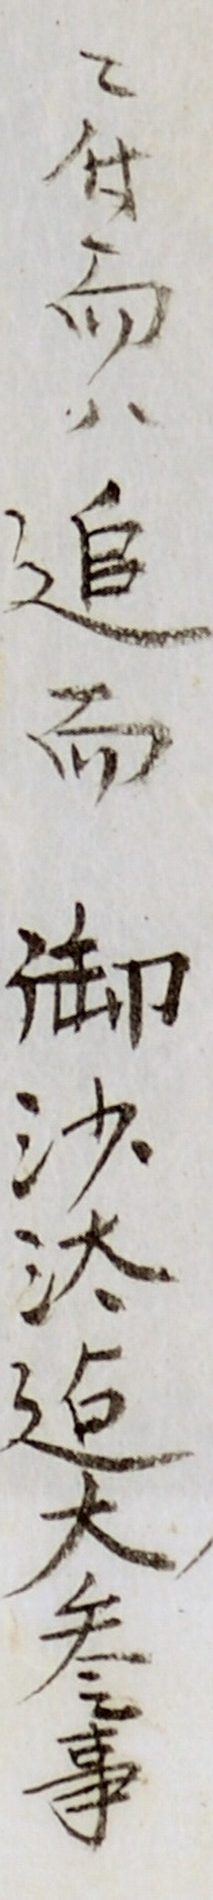ニ付てハ追て御沙汰迄大参事
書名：山林方諸事御用留
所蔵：伊那市立高遠町図書館・合同会社AMANE
